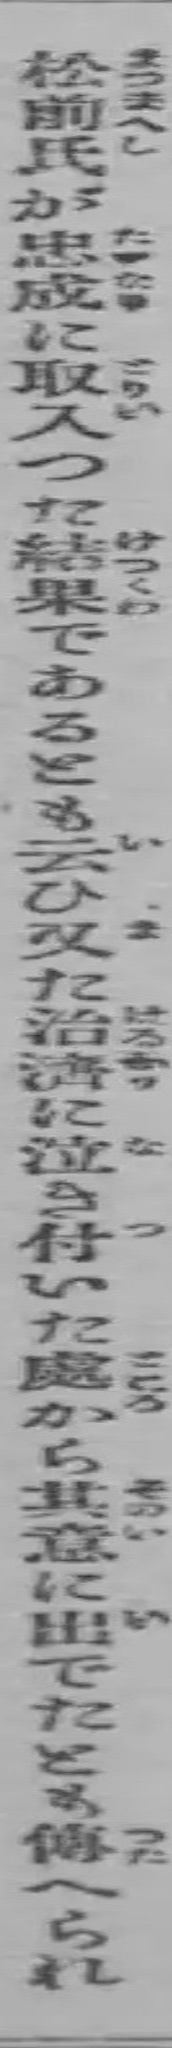松前氏が忠成に取入つた結果であるとも云ひ又た治済に泣き付いた処から其意に出でたとも伝へられ
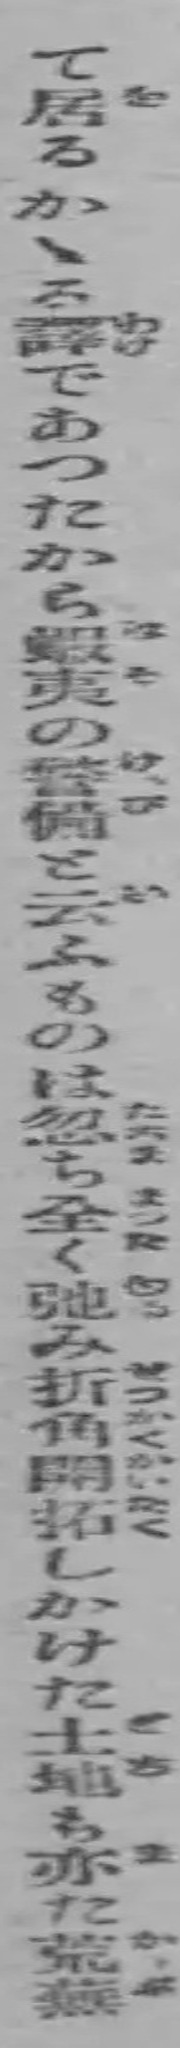て居るかゝる訳であつたから蝦夷の警備と云ふものは忽ち全く弛み折角開拓しかけた土地も亦た荒蕪
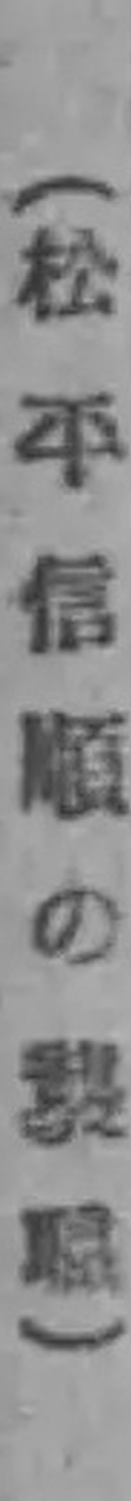⦿松平信順の襲職

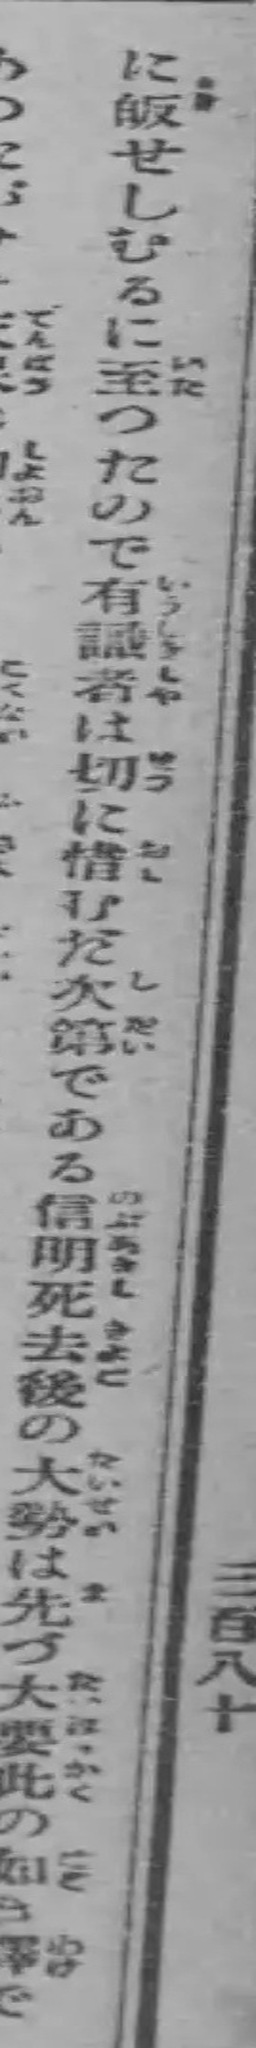に皈せしむるに至つたので有識者は切に惜むだ次第である信明死去後の大勢は先づ大要此の如き訳で
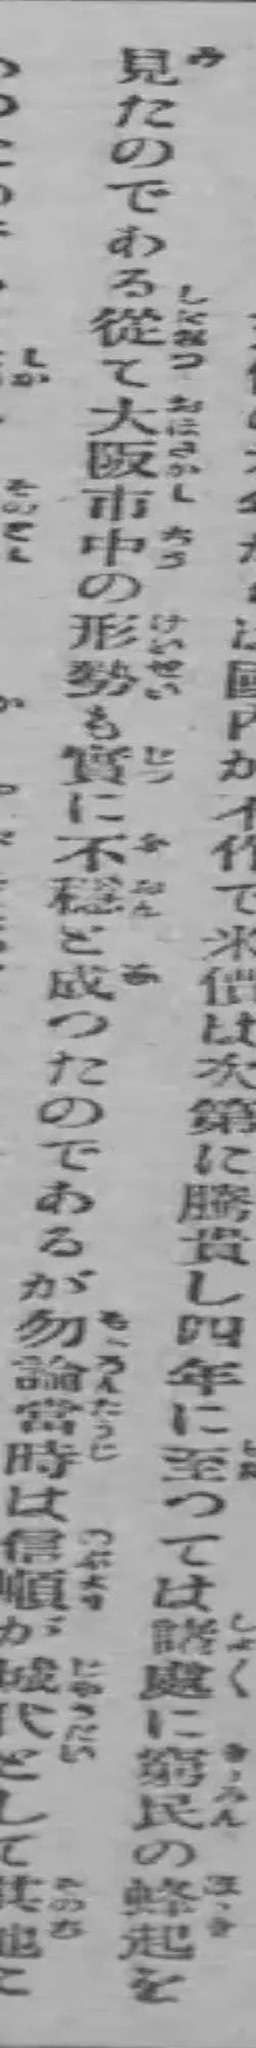見たのである従て大阪市中の形勢も実に不穏と成つたのであるが勿論当時は信順が城代として其地に
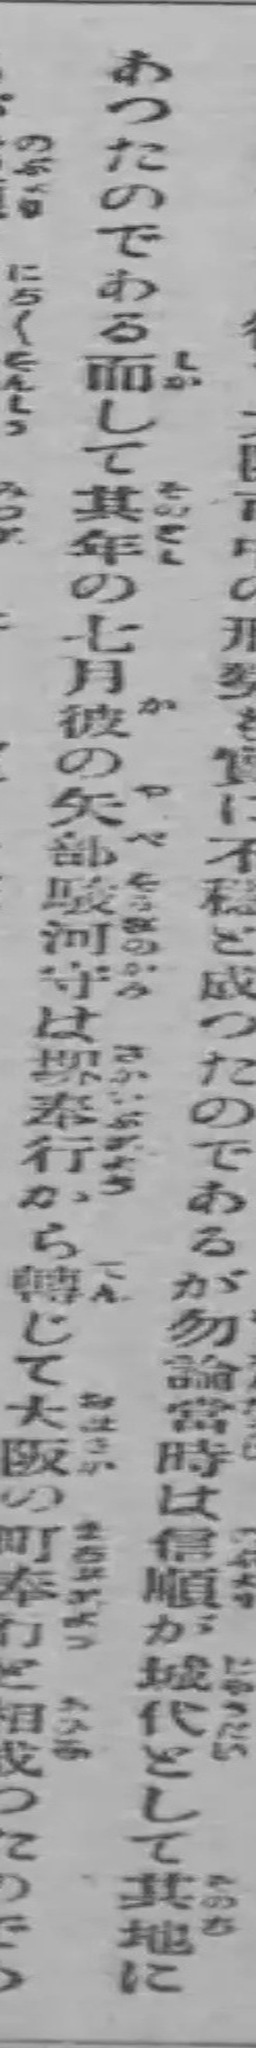あつたのである而して其年の七月彼の矢部駿河守は堺奉行から転じて大阪の町奉行と相成つたのであ
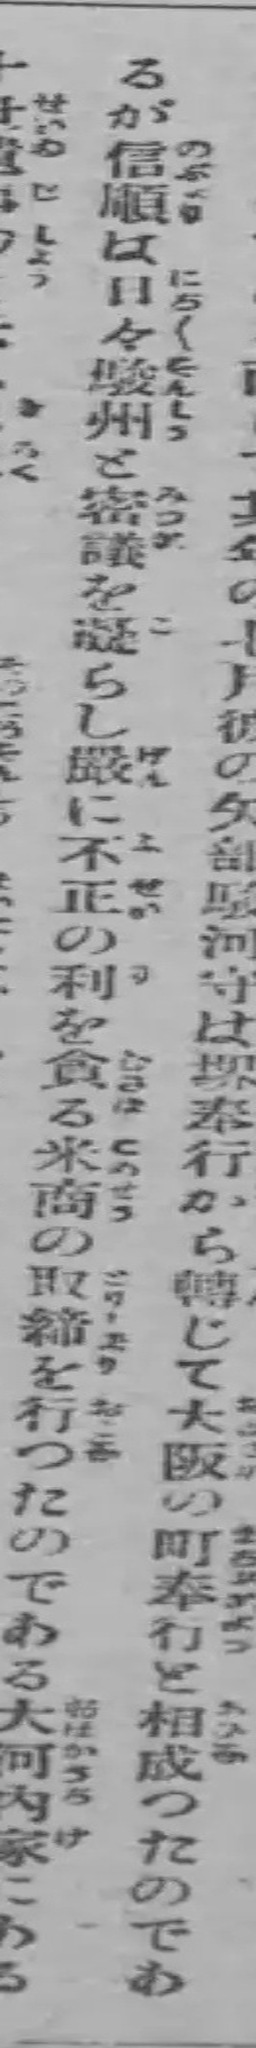るが信順は日々駿州と蜜議を凝らし厳に不正の利を貪る米商の取締を行つたのである大河内家にある
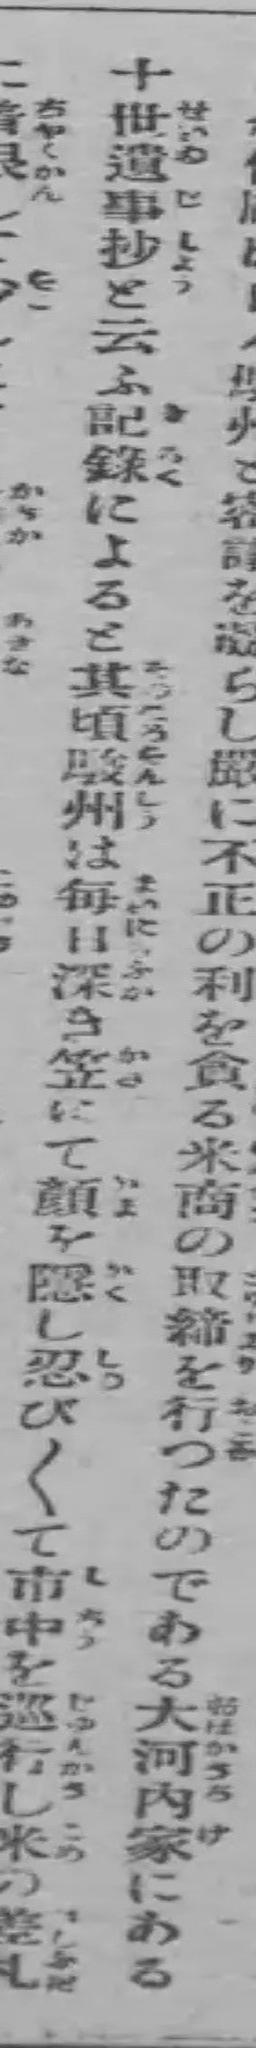十世遺事抄と云ふ記録にると其頃駿州には毎日深き笠にて顔を隠し忍び〳〵て市中を巡行し米の差札
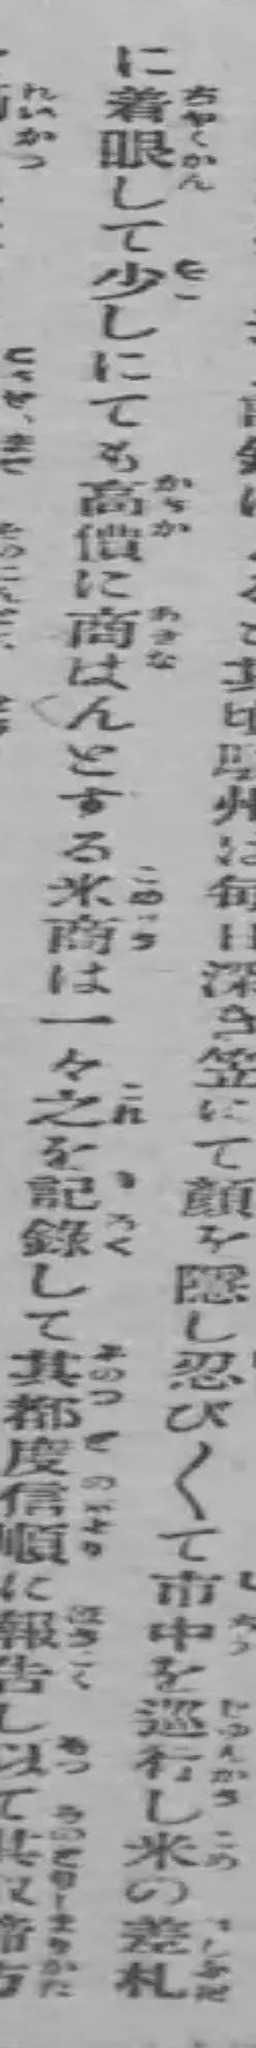に着眼して少しにても高価に商はんとする米商は一々之を記録して其都度信順に報告し以て其取締方
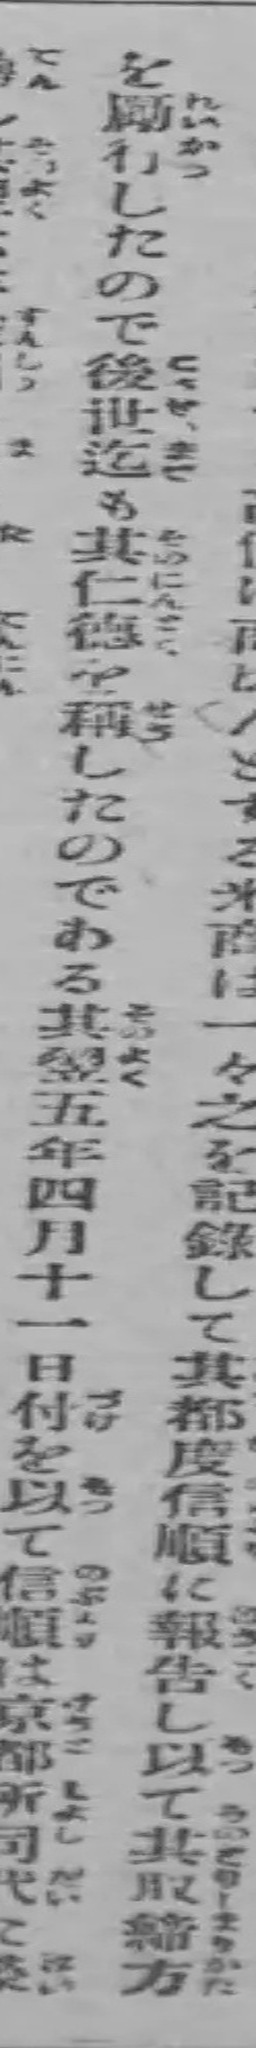を励行したので後世迄も其仁徳を称したのである其翌五年四月十一日付を以て信順は京都所司代に栄
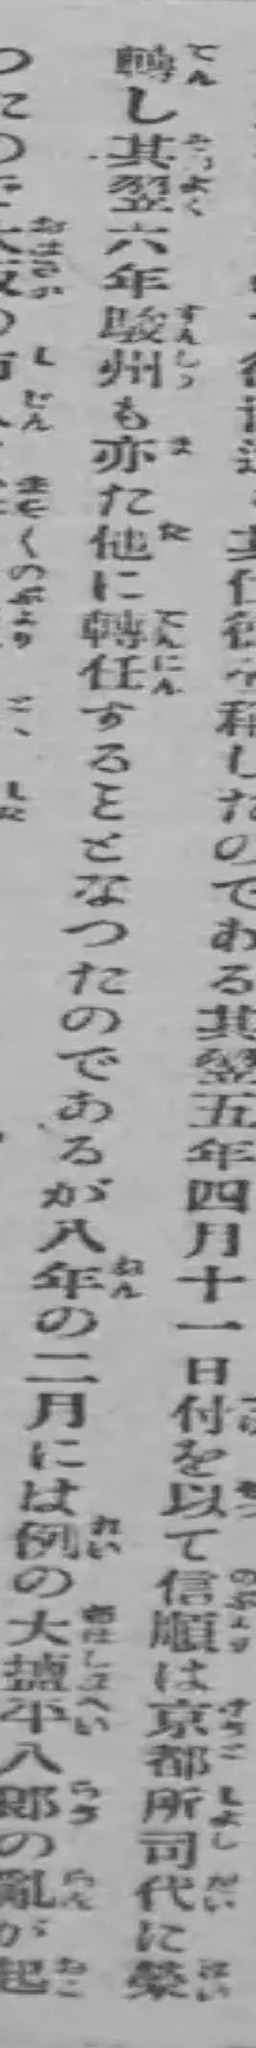転し其翌六年駿州も亦た他に転任することとなつたのであるが八年の二月には例の大塩平八郎の乱が起
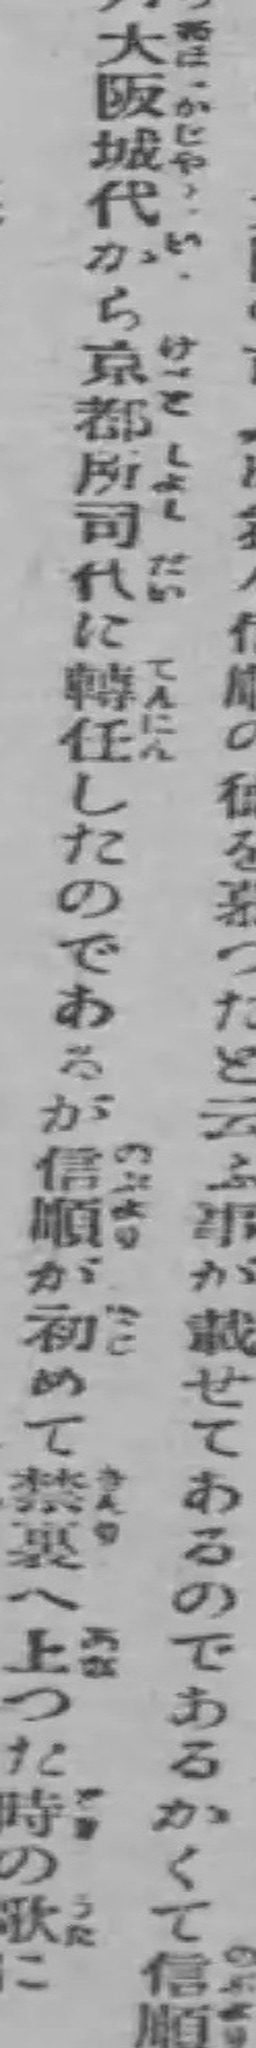月大阪城代から京都所司代に転任したのであるが信順が初めて禁裏へ上つた時の歌に
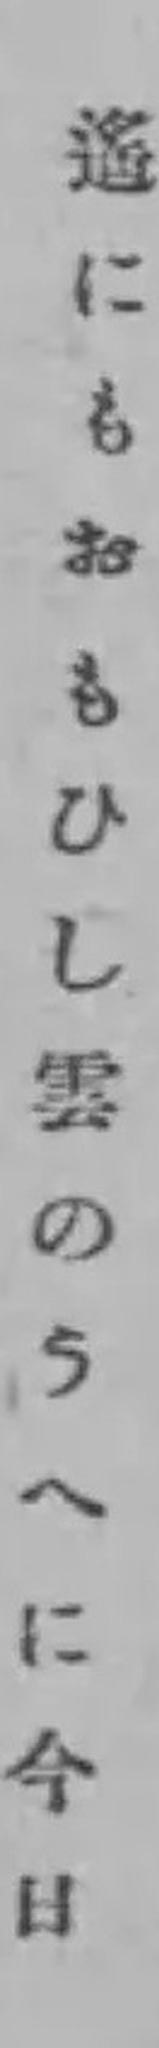遥にもおもひし雲のうへに今日
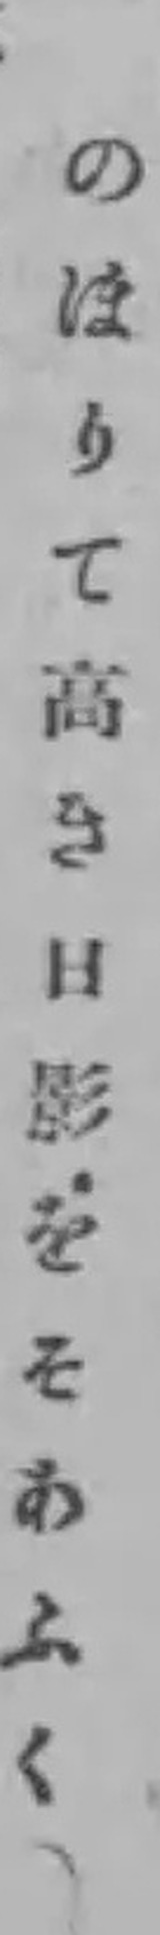のほりて高き日影をそあふく
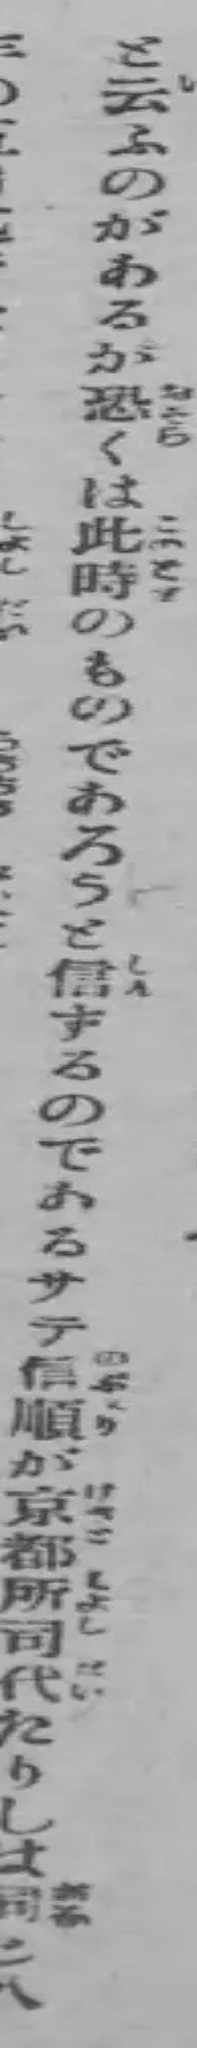と云ふのがあるが恐くは此時のものであろうと信ずるのであるサテ信順が京都所司代たりしは同じ八
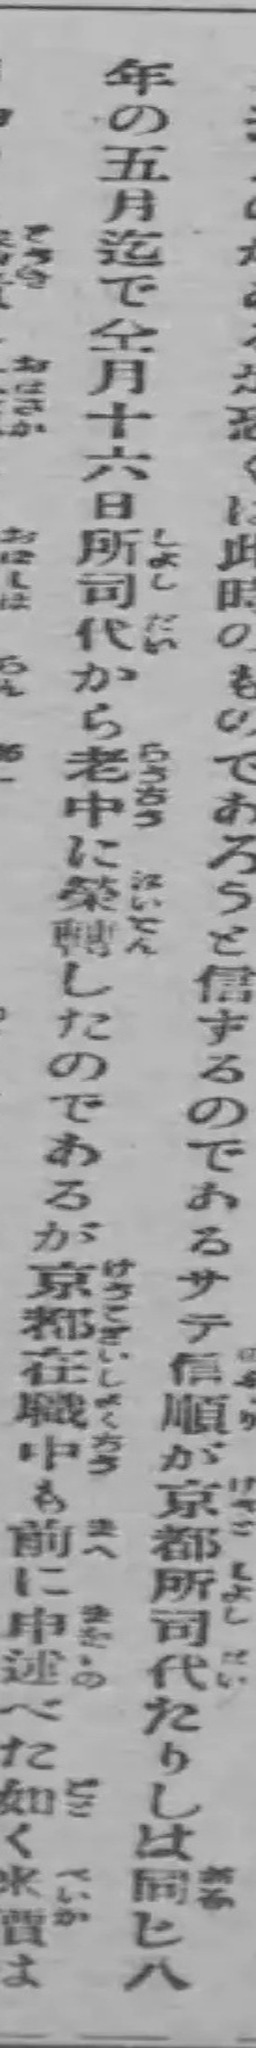年の五月迄で仝月十六日所司代から老中に栄転したのであるが京都在職中も前に申述べた如く米価は
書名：豊橋市史談
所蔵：国立国会図書館 National Diet Library, JAPAN
